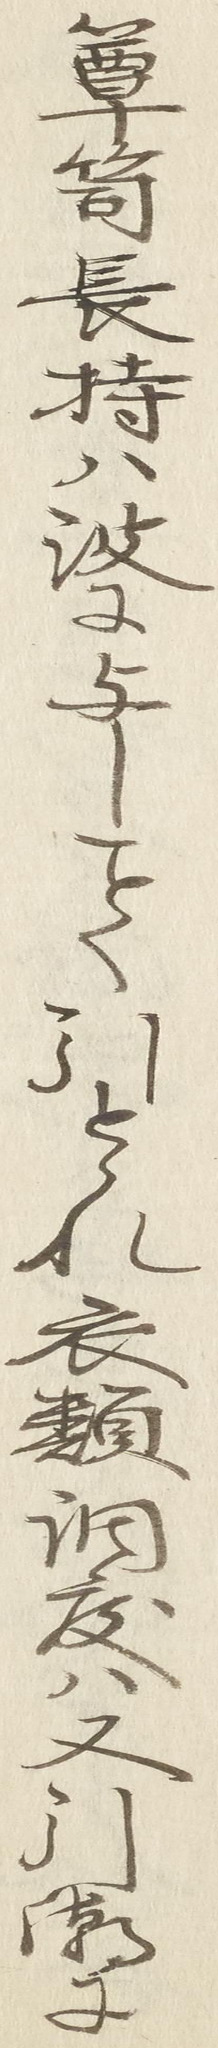箪笥長持は波に与しことく引とられ衣類調度は又引潮に
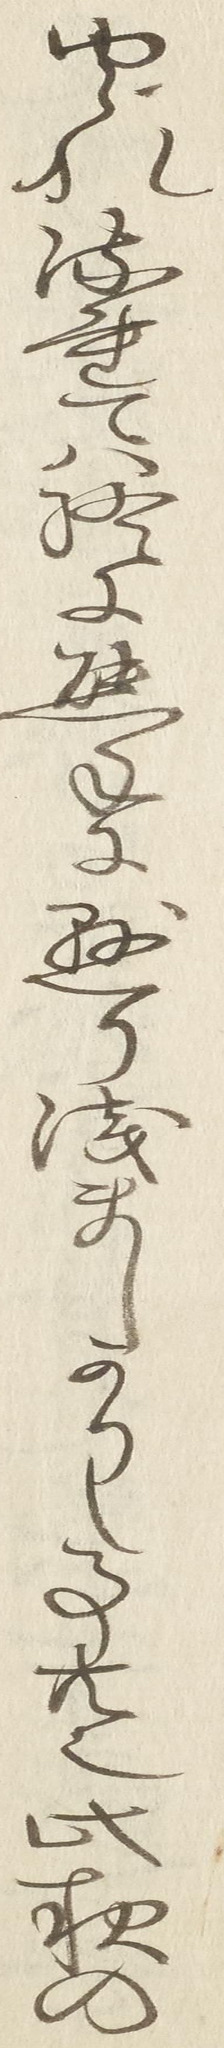ゆられ流れては終に熊手に懸り浅ましかりし事共也此夜の
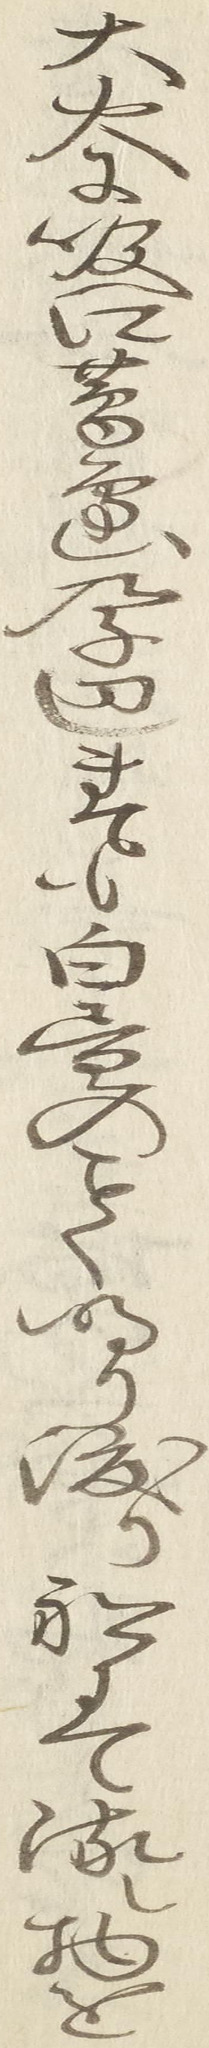大火に吸江葛島孕辺まても白昼のことく明り渡り船にて流し物を
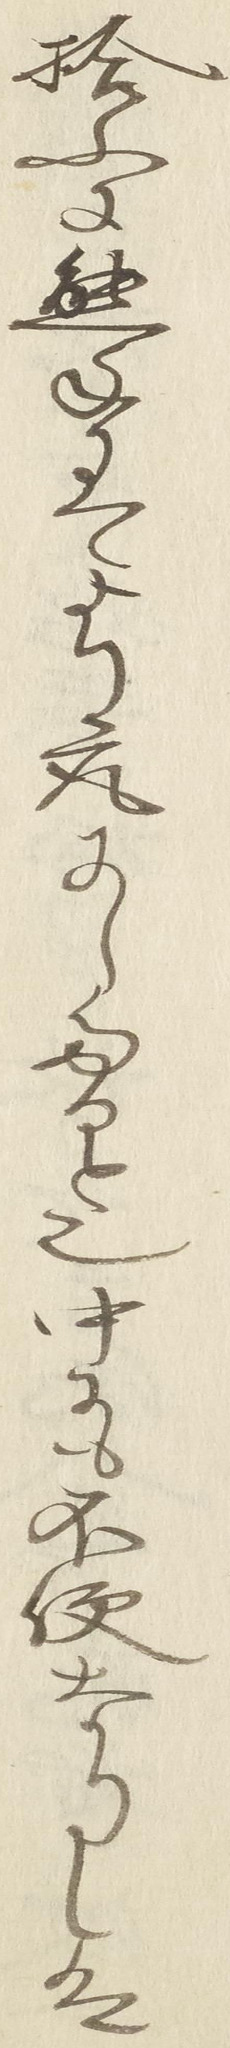拾ふに熊手にてより取にしたると也中にも不便なりしは
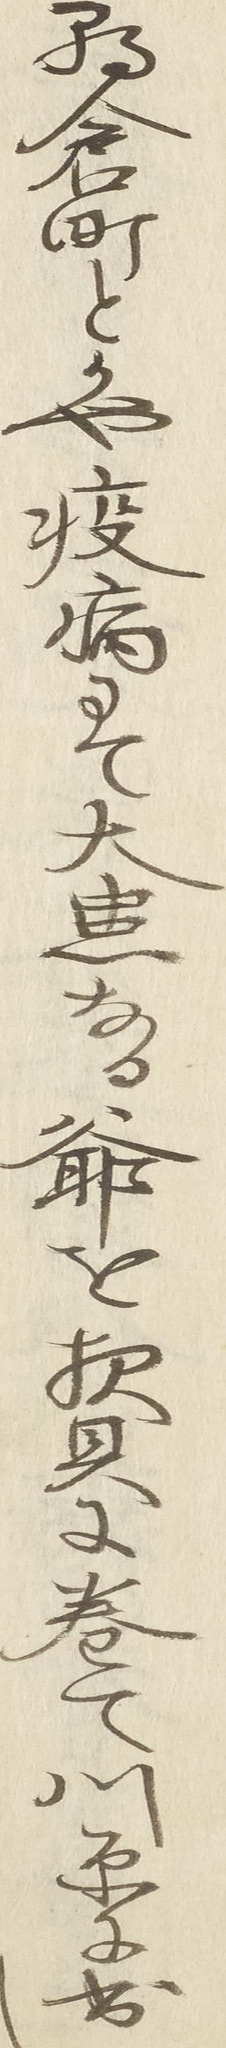朝倉町とかや疫病にて大患なる爺を夜具に巻て川原に出し

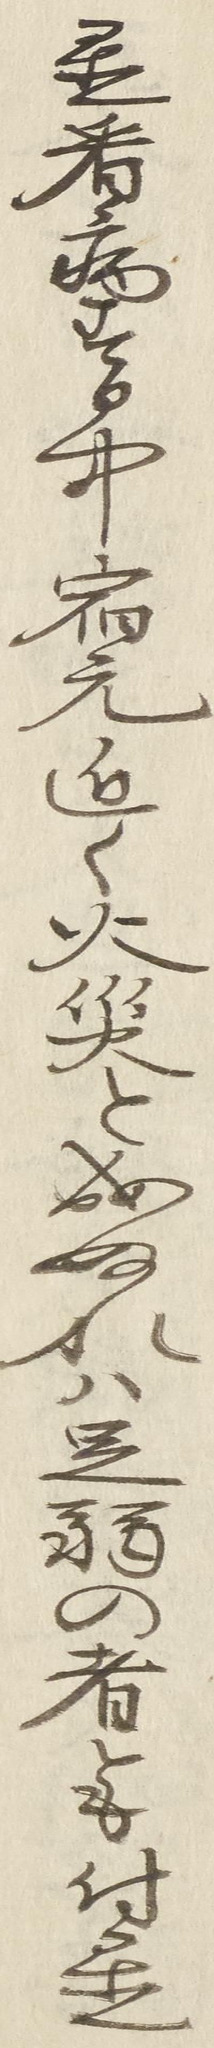隠匿置看病する中宿元近く火災と成ぬれは足弱の者とも付置
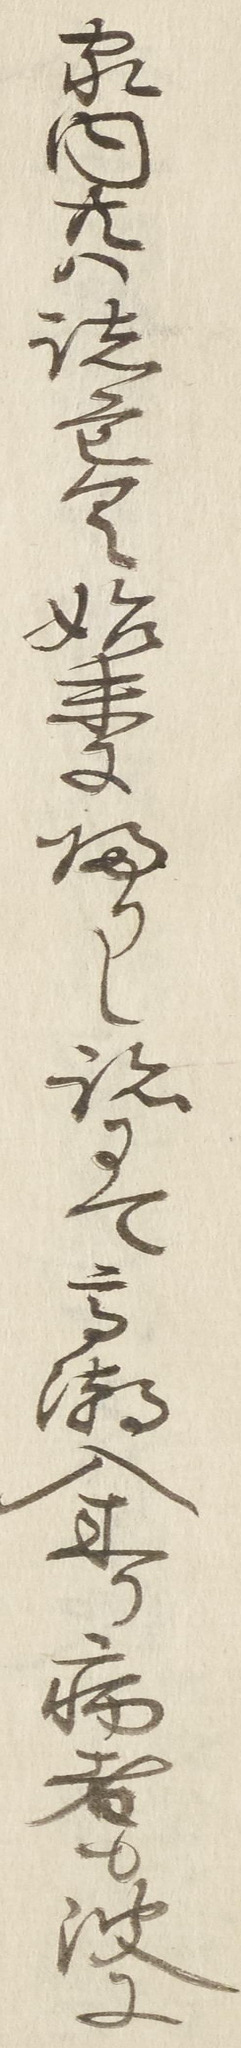家内共諸道具始末に帰りし跡にて高潮入来り病者も波に
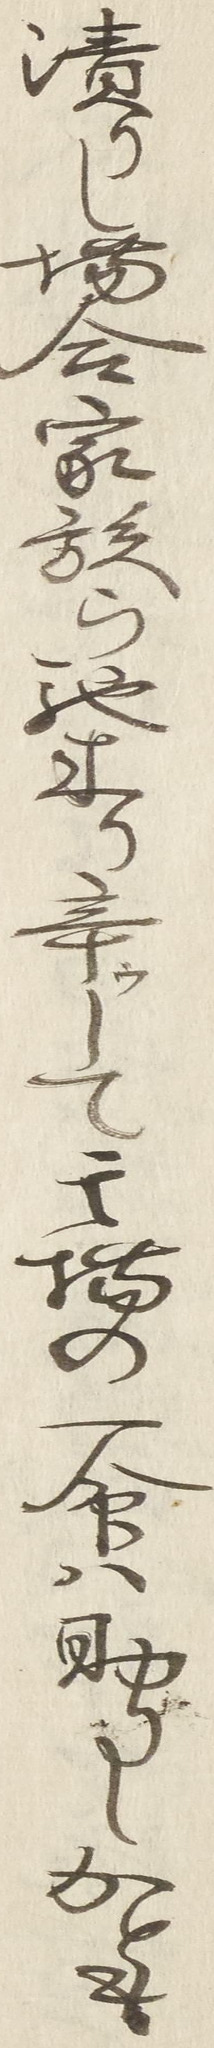漬りし場合家族ら馳来り辛うして其場の一命は助りしかとも
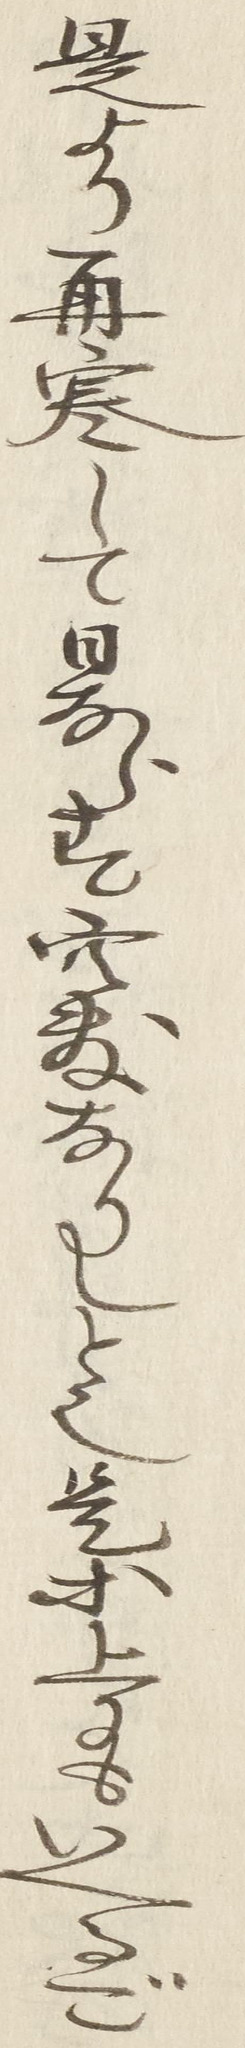是より再寒して日ならす空敷なりしと也是等上にもいへるご
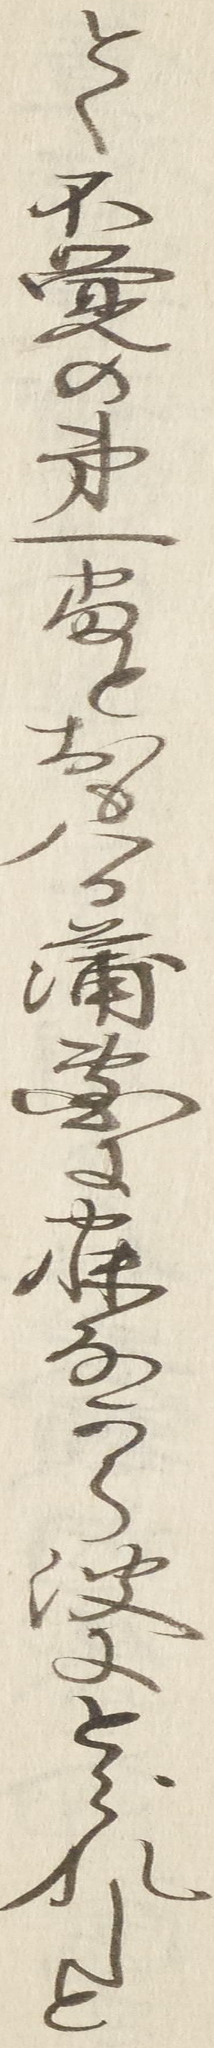とく不覚の第一番とおもはる蒲団に寝なから波にとられしと
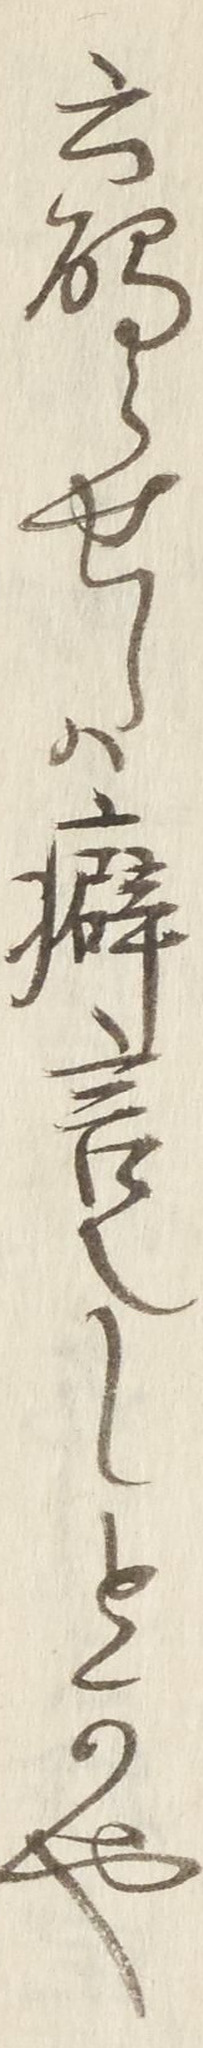云触らせしは癖言也しとかや
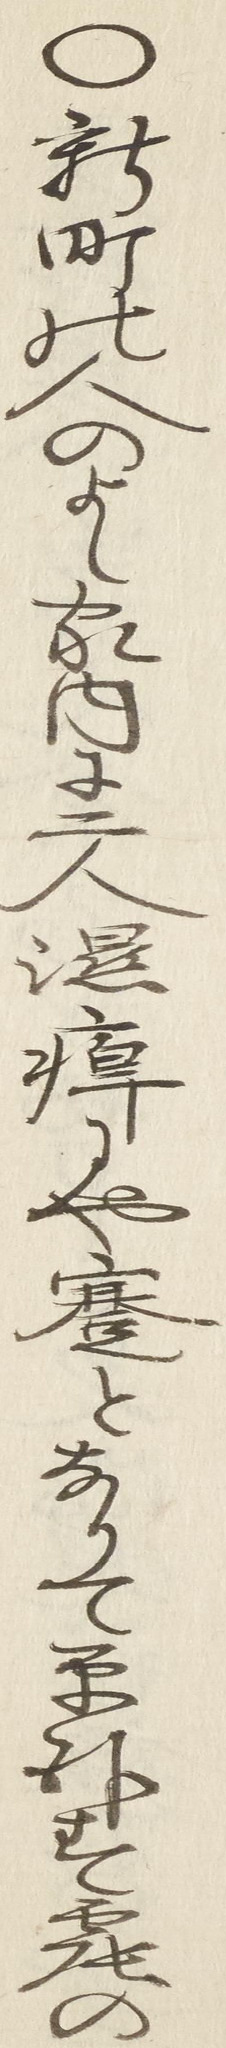〇新町の人のよし家内に湿痺にや蹇となりて平臥す震の
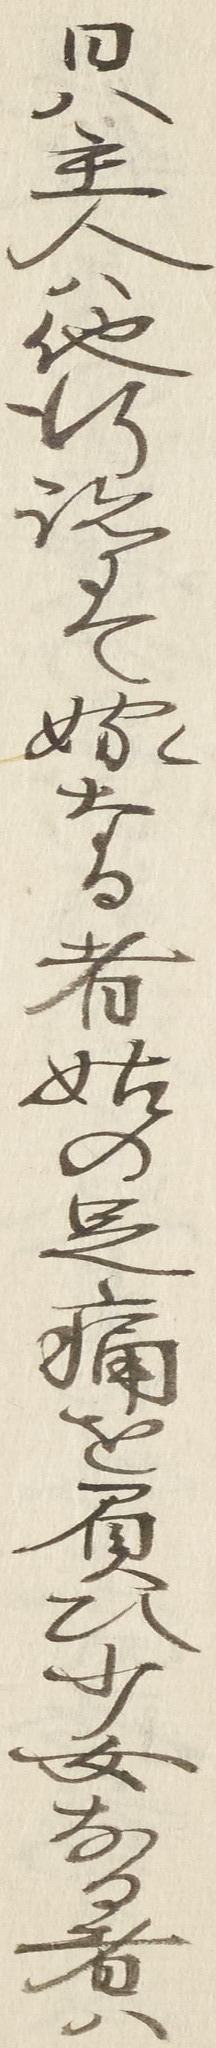日は主人は他行跡にて嫁なる者姑の足痛を負ひ少女なる者は
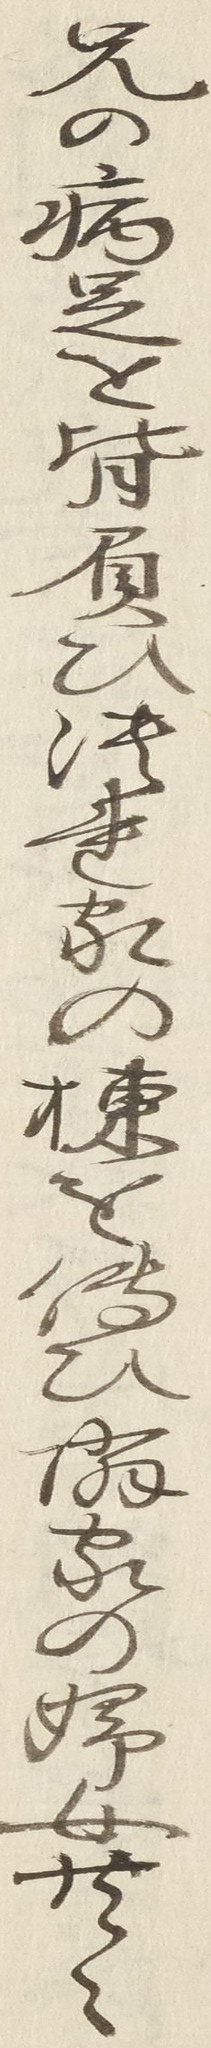兄の病足を背負ひ潰れ家の棟を伝ひ隣家の婦女共々
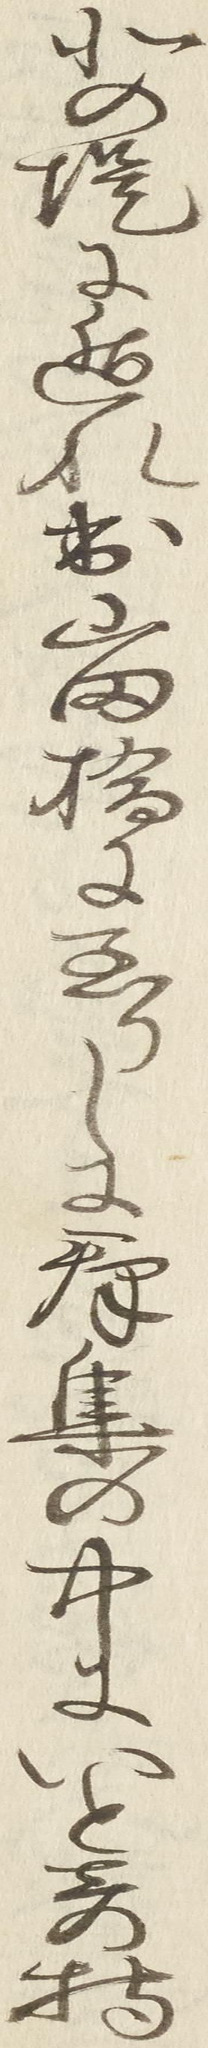北の堤に遁れ出山田橋に至りしに群集の中にいと奇特
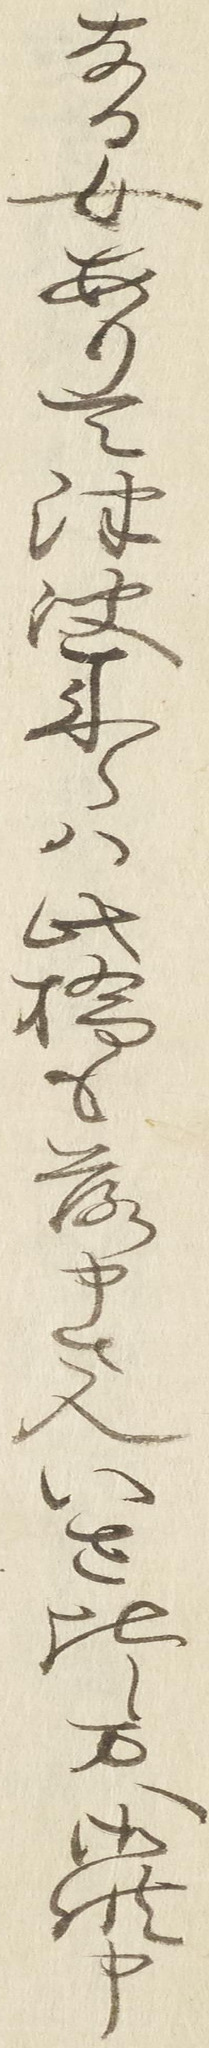なる女ありて津波来らは此橋も落申さんいさ比しまへ御供申
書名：地震記　上
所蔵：東京大学地震研究所図書室 Earthquake Research Institute Library, The University of Tokyo, JAPAN
